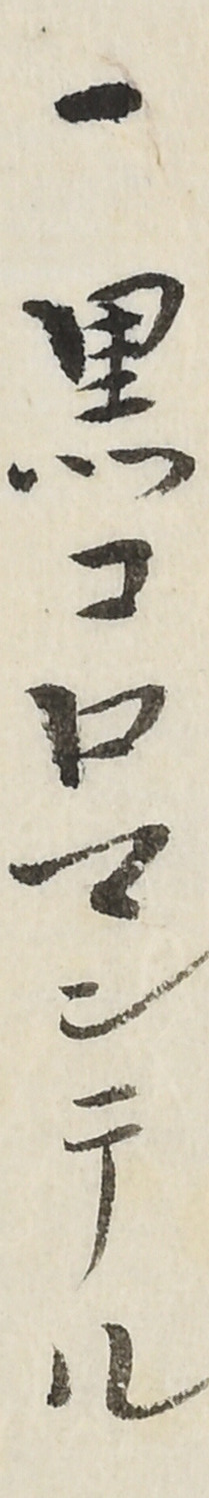一黒コロマンテル
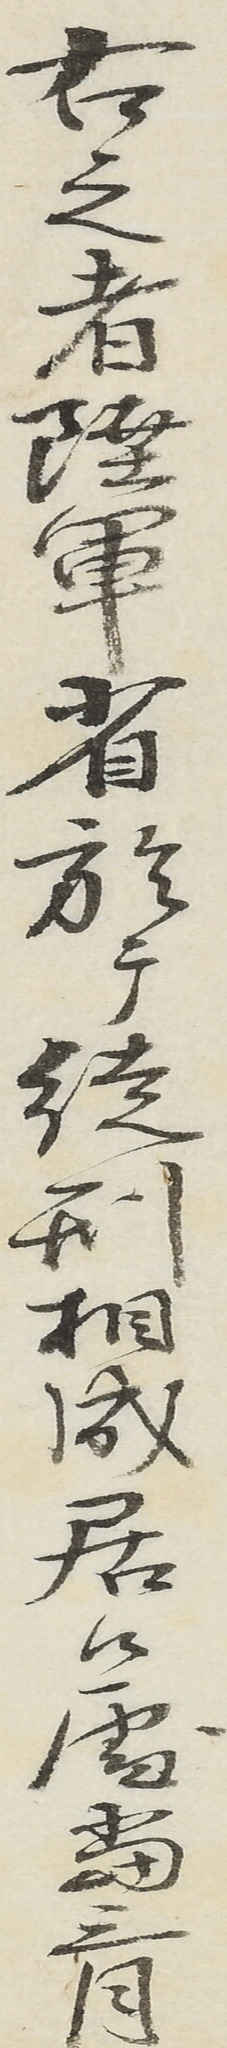右之者陸軍省於テ徒刑相成居候処当三月
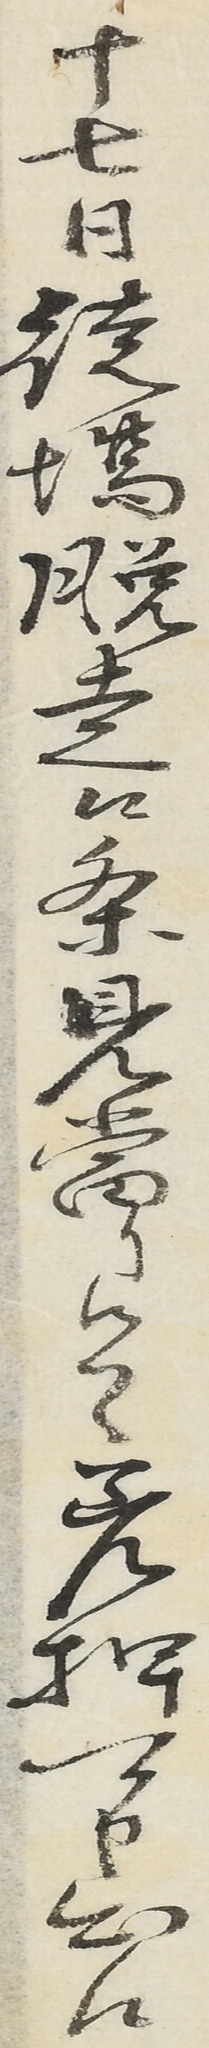十七日徒場脱走候条見当リ候ハヽ差押可申出候
